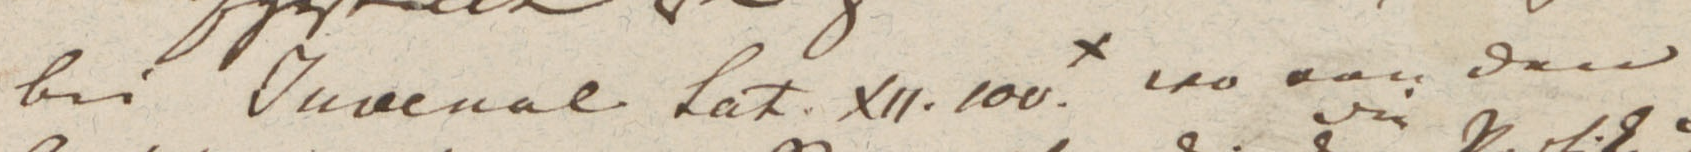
bei Juvenal Sat. XII. 100. % wo von den
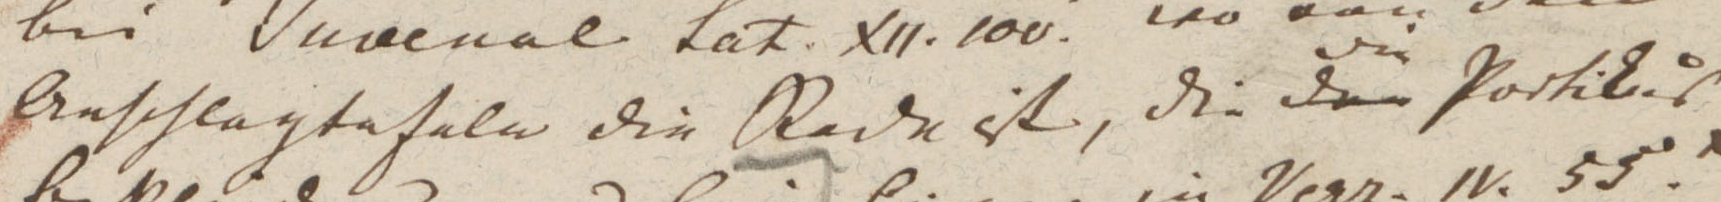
Anschlagtafeln die Rede ist, die den die Portikus
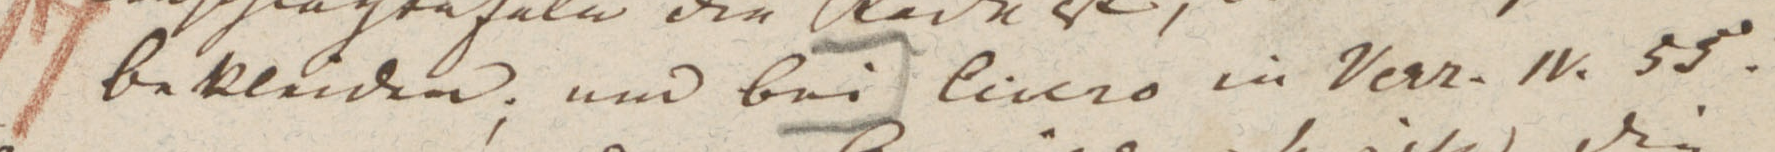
bekleiden; und bei% Cicero in Verr. IV. 55.%
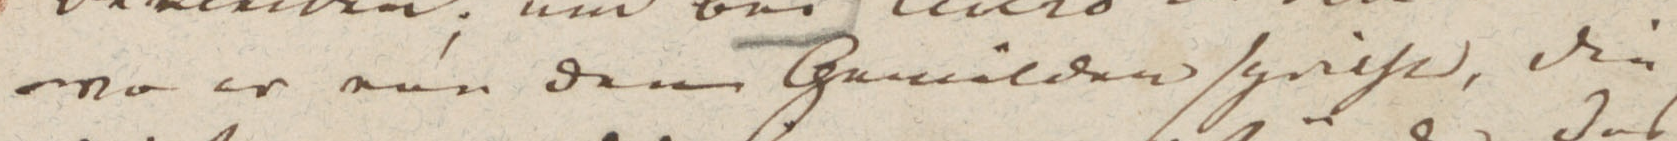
wo er von den Gemälden spricht, die
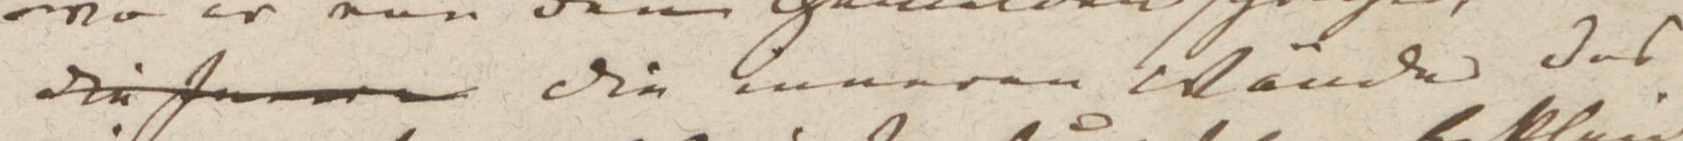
die Innere die inneren Wände des
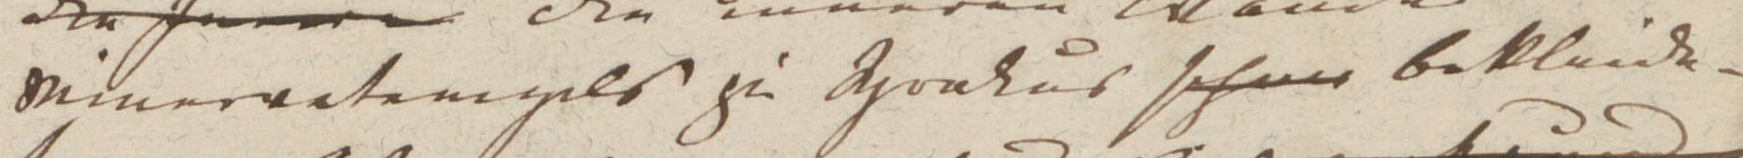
Minervatempels zu Syrakus schon bekleide-
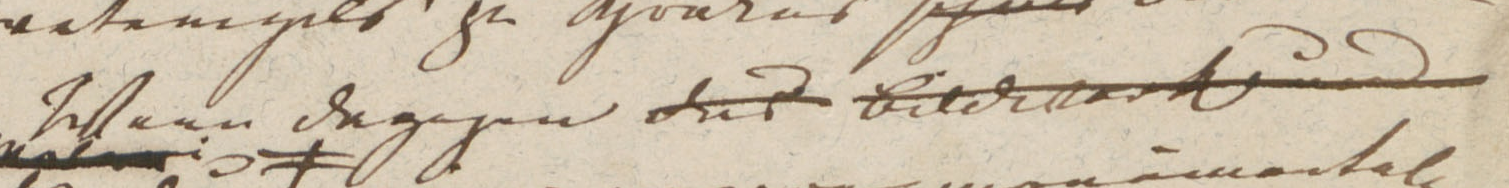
Wenn dagegen das Bildwerk und
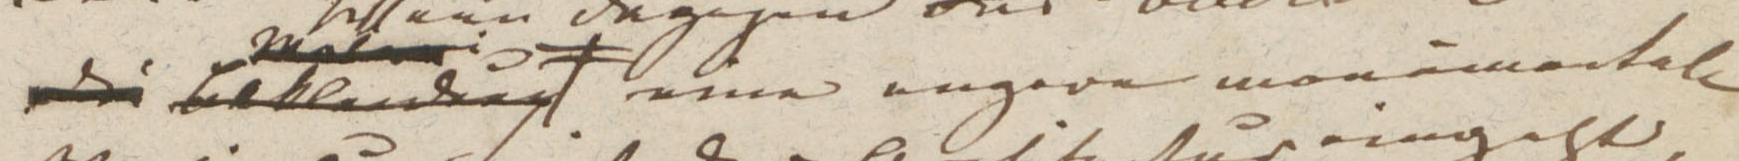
die Bekleidung Malerei % eine engere monumentale
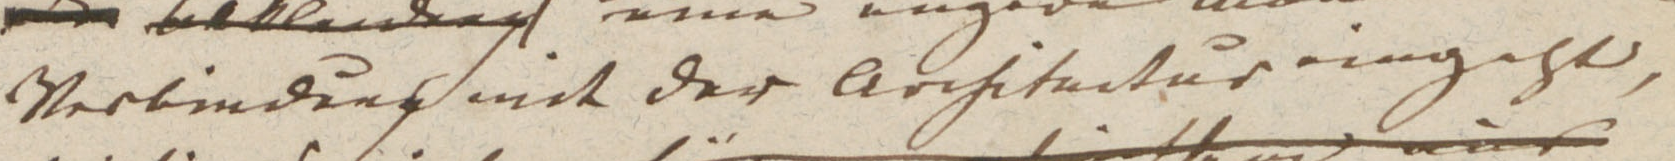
Verbindung mit der Architectur eingeht,
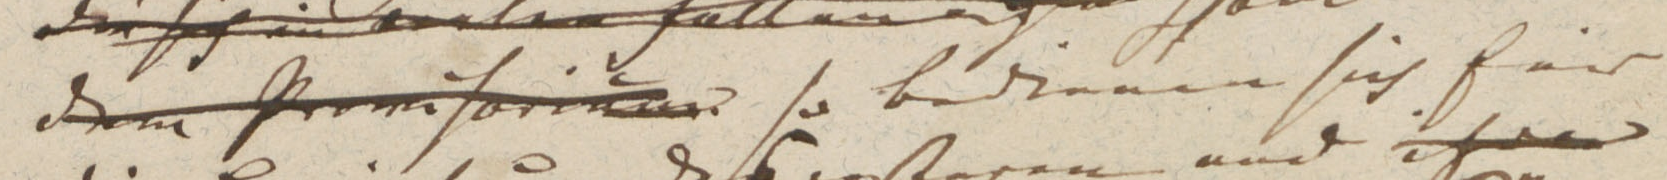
dem Provisorium so bedienen sich für
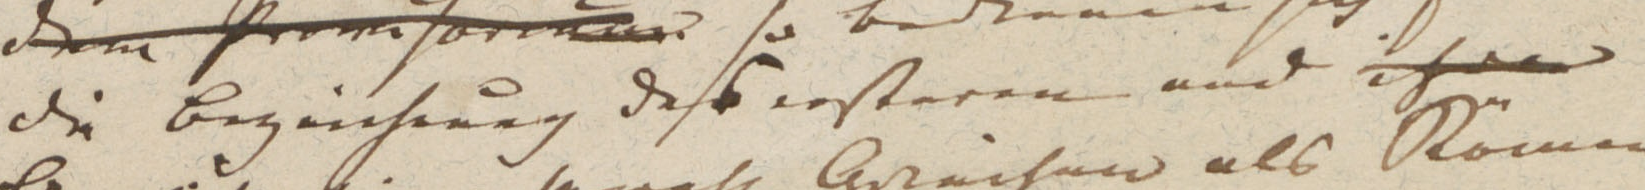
die Bezeichnung des ersteren und ihre
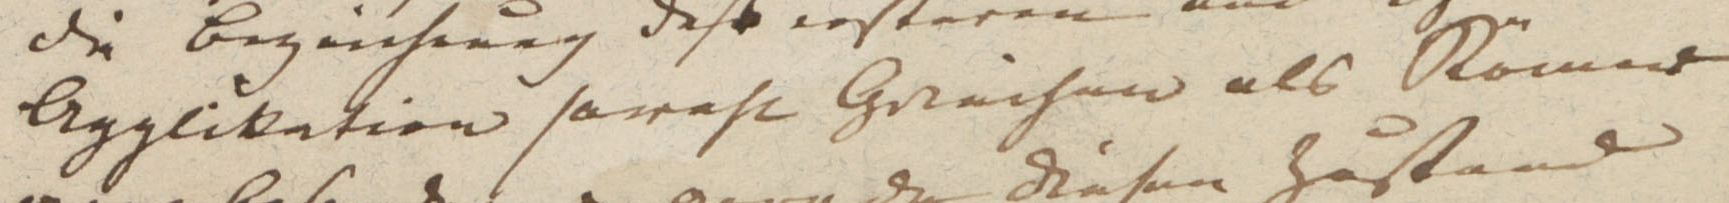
Applikation sowohl Griechen als Römer
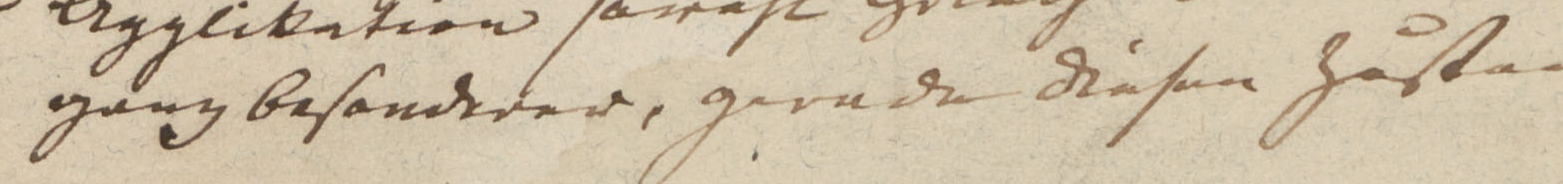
ganz besonderer, gerade diesen Zustand
